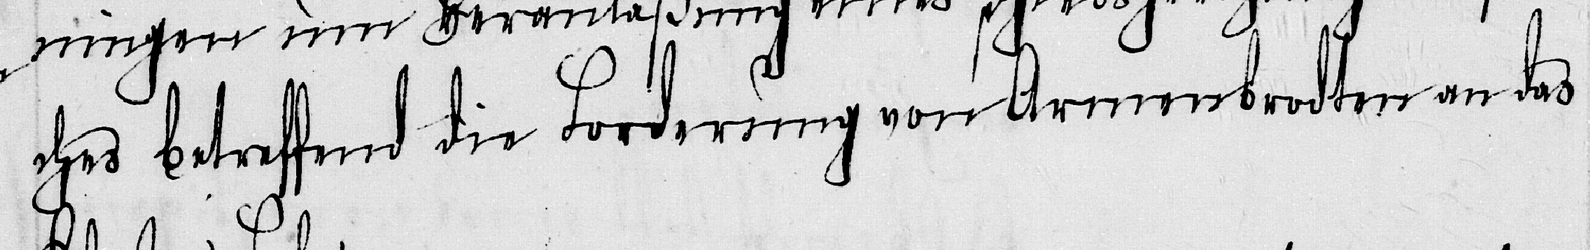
ches betreffend die Forderung von Armenbrodten an das
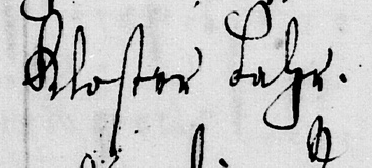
Kloster Fahr.
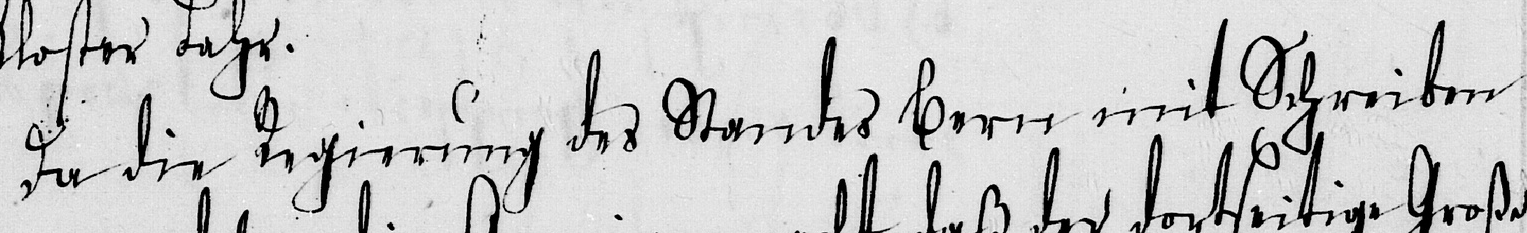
Da die Regierung des Standes Bern mit Schreiben
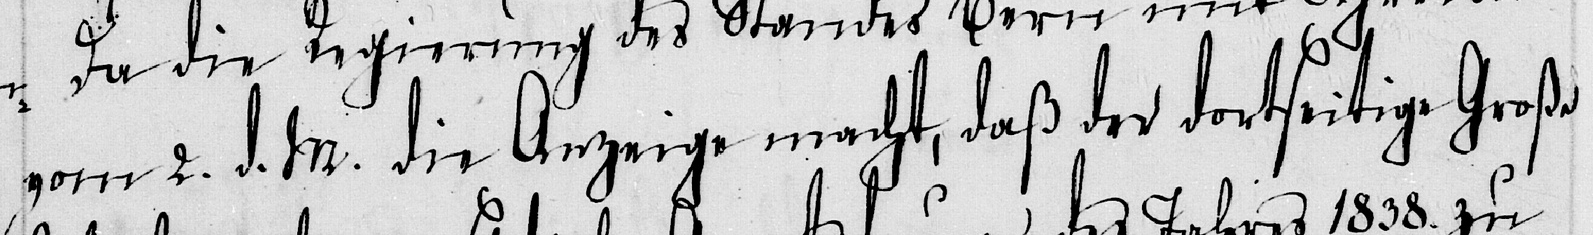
vom 2. d. M. die Anzeige macht, daß der dortseitige Große
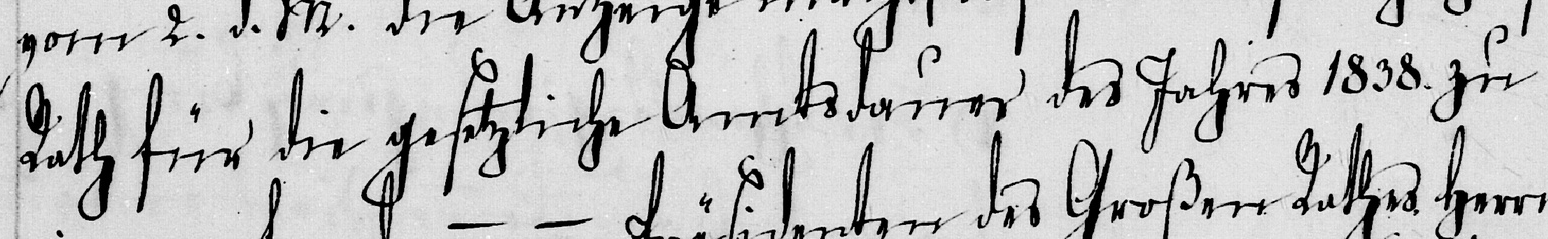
Rath für die gesetzliche Amtsdauer des Jahres 1838. zu
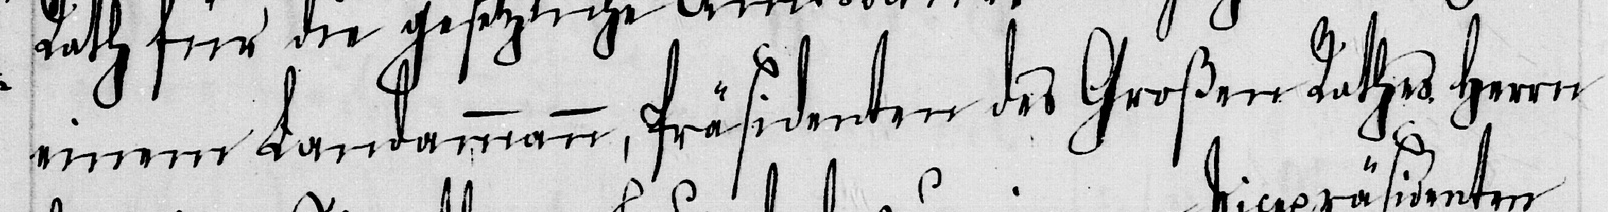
einem Landammann, Präsidenten des Großen Rathes Herrn
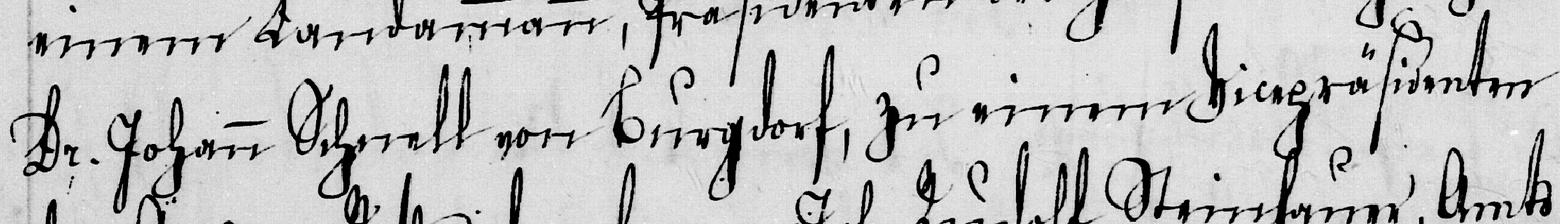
Dr. Johann Schnell von Burgdorf, zu einem Vicepräsidenten
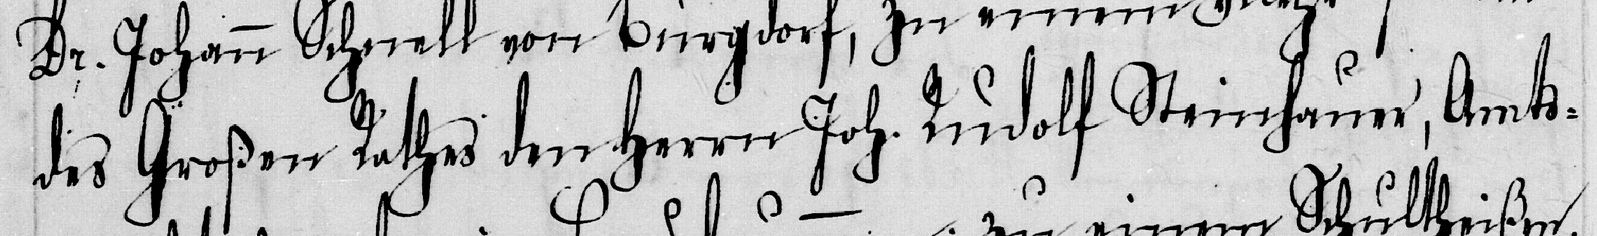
des Großen Rathes den Herrn Joh. Rudolf Steinhauer, Amts¬
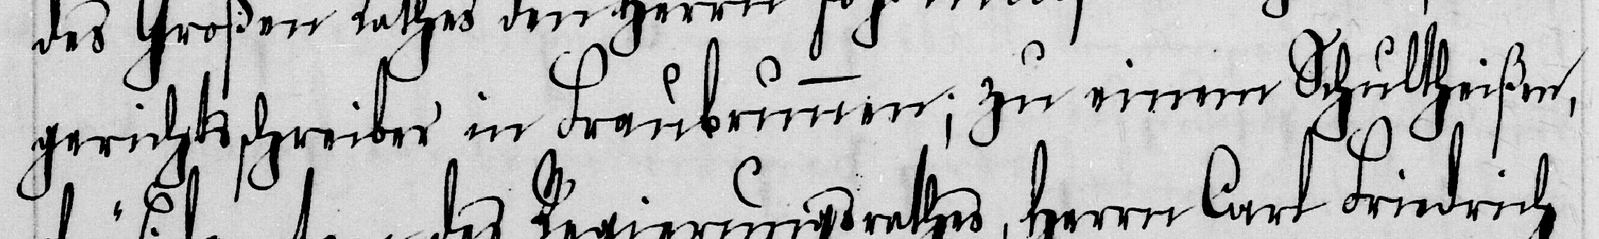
gerichtsschreiber in Fraubrunnen; zu einem Schultheißen,
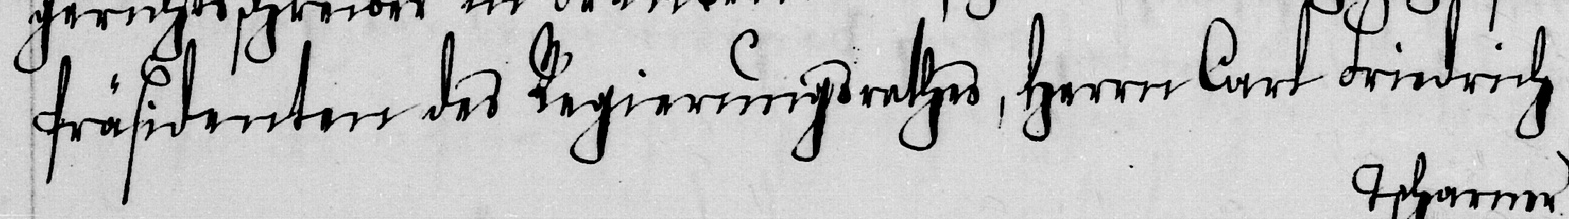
Präsidenten des Regierungsrathes, Herrn Carl Friedrich
